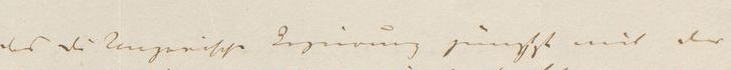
das die Ungarische Regierung jüngst mit der
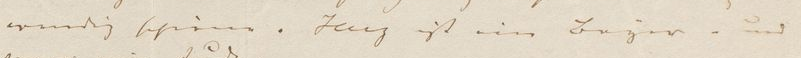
wendig schiene. Herz ist ein Bayer – und
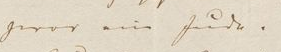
zwar ein Jude.
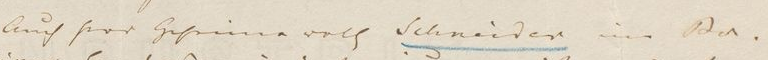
Auch Herr Geheimerrath Schneider im Ber-
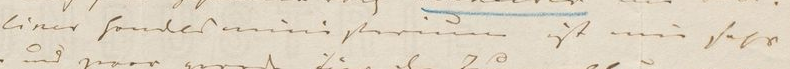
liner Handelsministerium ist mir sehr
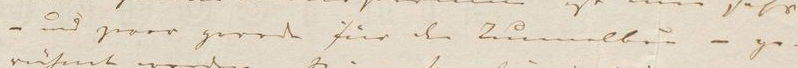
– und zwar gerade für den Tunnelbau – ge-
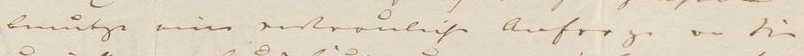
benutze eine vertrauliche Anfrage an Sie
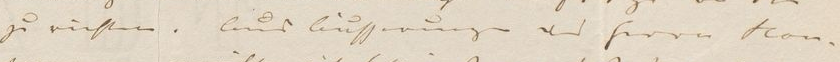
zu richten. Aus Äusserungen des Herrn Han-
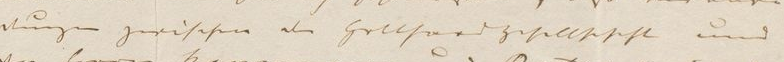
dungen zwischen der Gotthardgesellschaft und
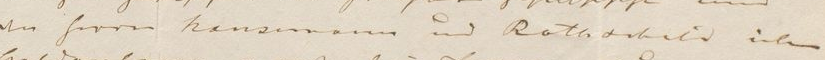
den Herren Hansemann und Rothschild über
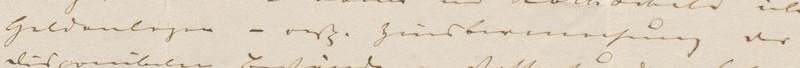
Geldanlagen – resp. Zinsvermachung der
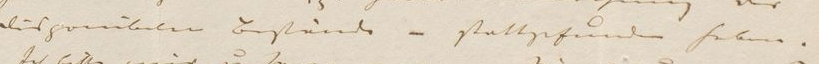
disponibeln Bestände – stattgefunden haben.
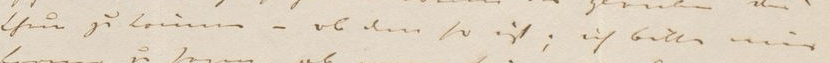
thun zu können – ob dem so ist; ich bitte mir
